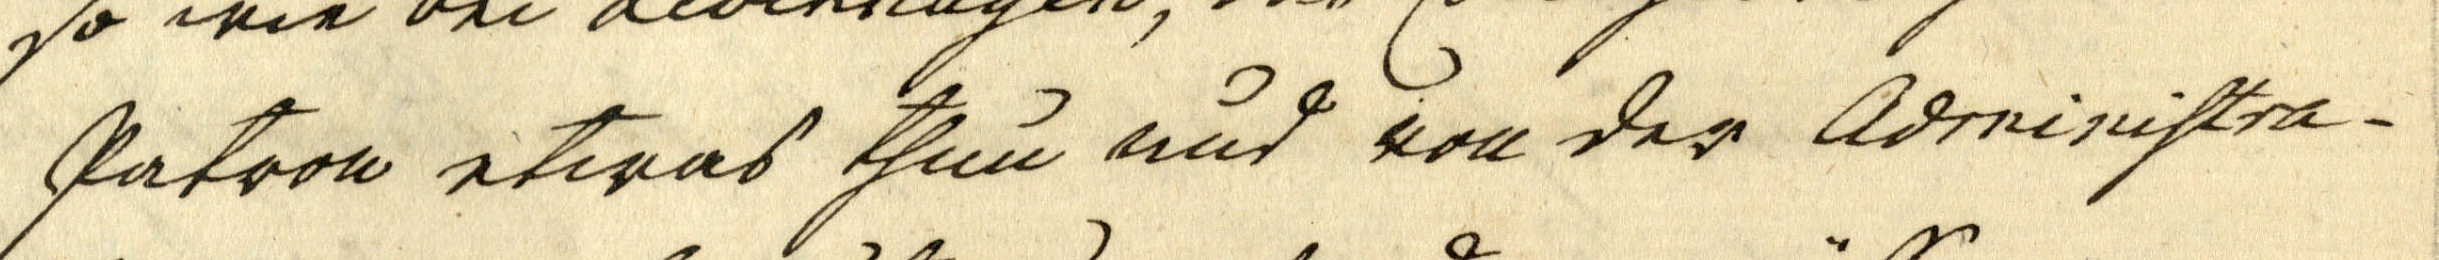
Patron etwas thun und von der Administra-
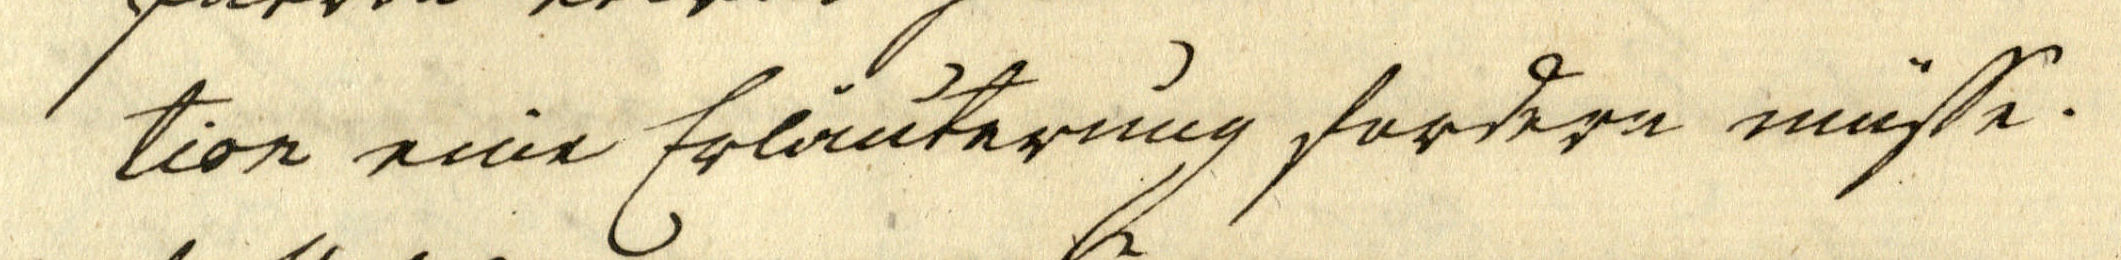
tion eine Erläuterung fordern müsse.
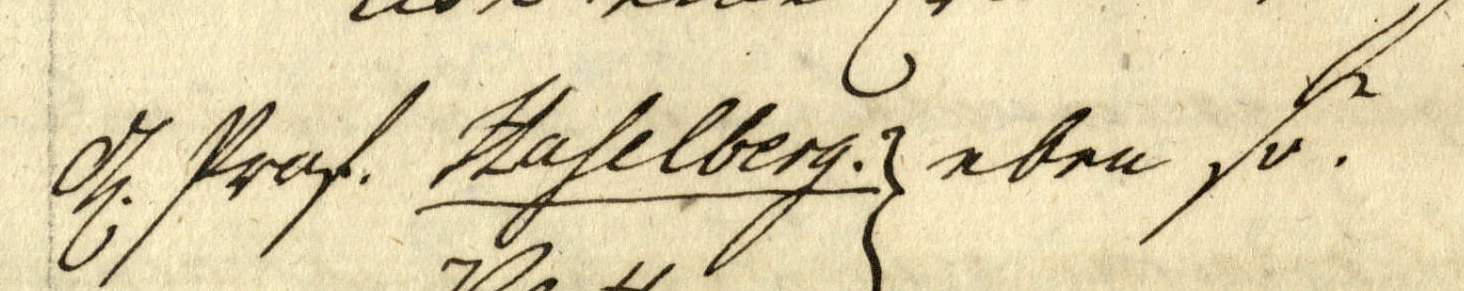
dh. Prof. Haselberg. eben so.
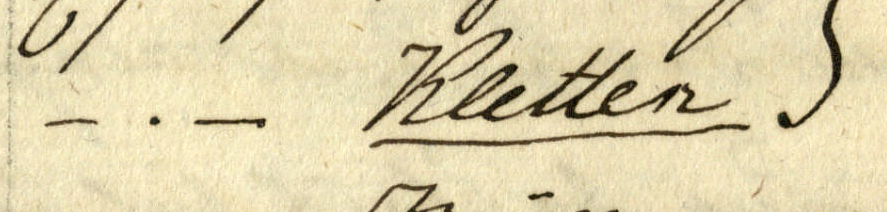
- " - Kletten
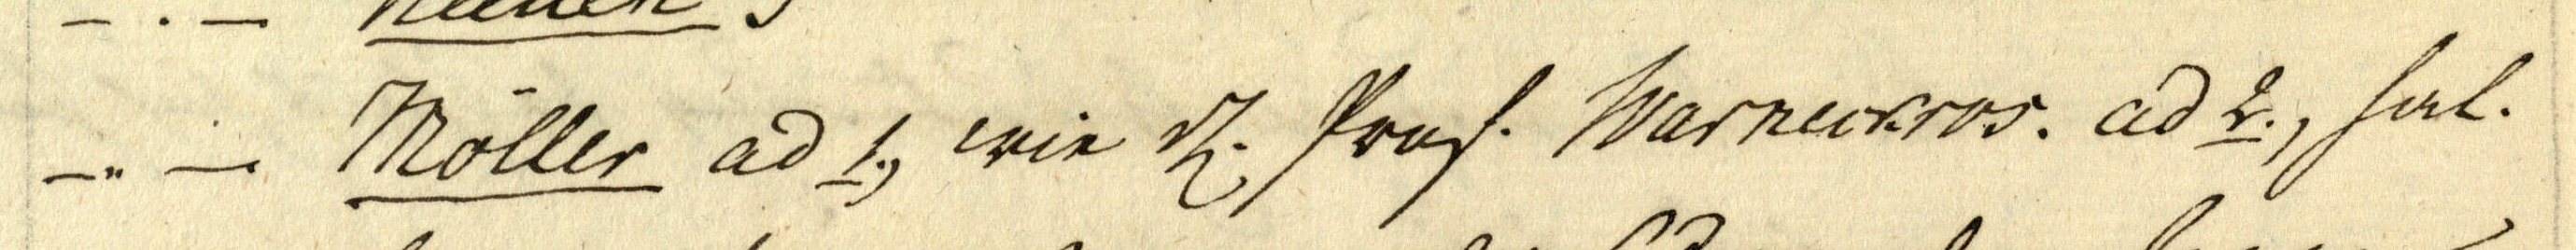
- " - Möller ad 1., wie dh. Prof. Warneckros. ad 2., hal-
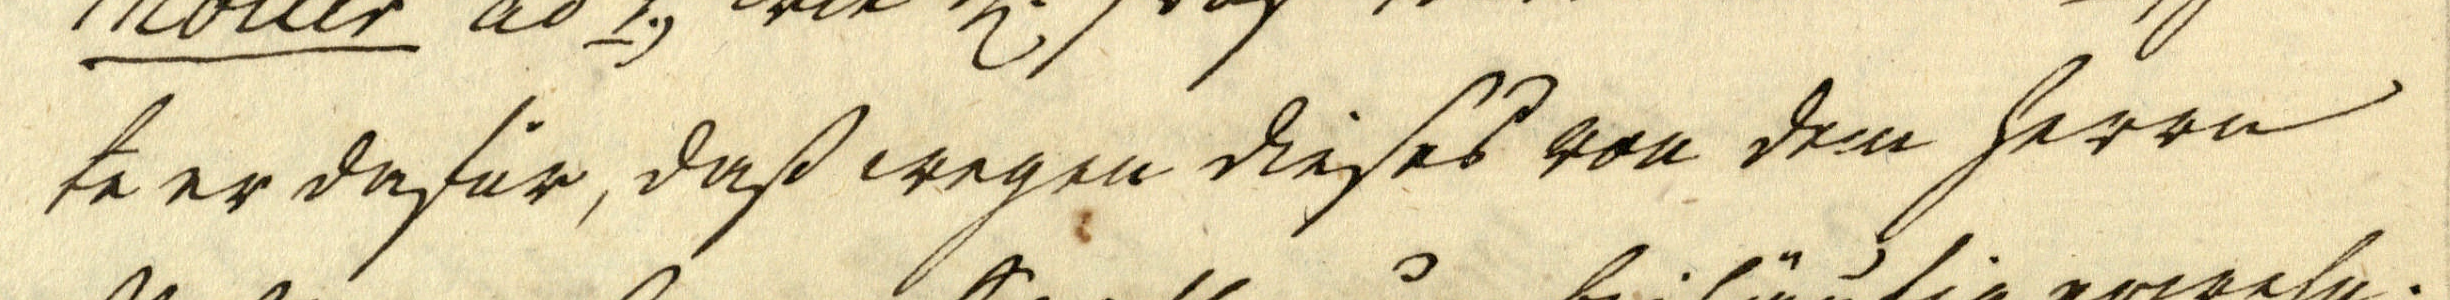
te er dafür, daß wegen dieses von dem herrn
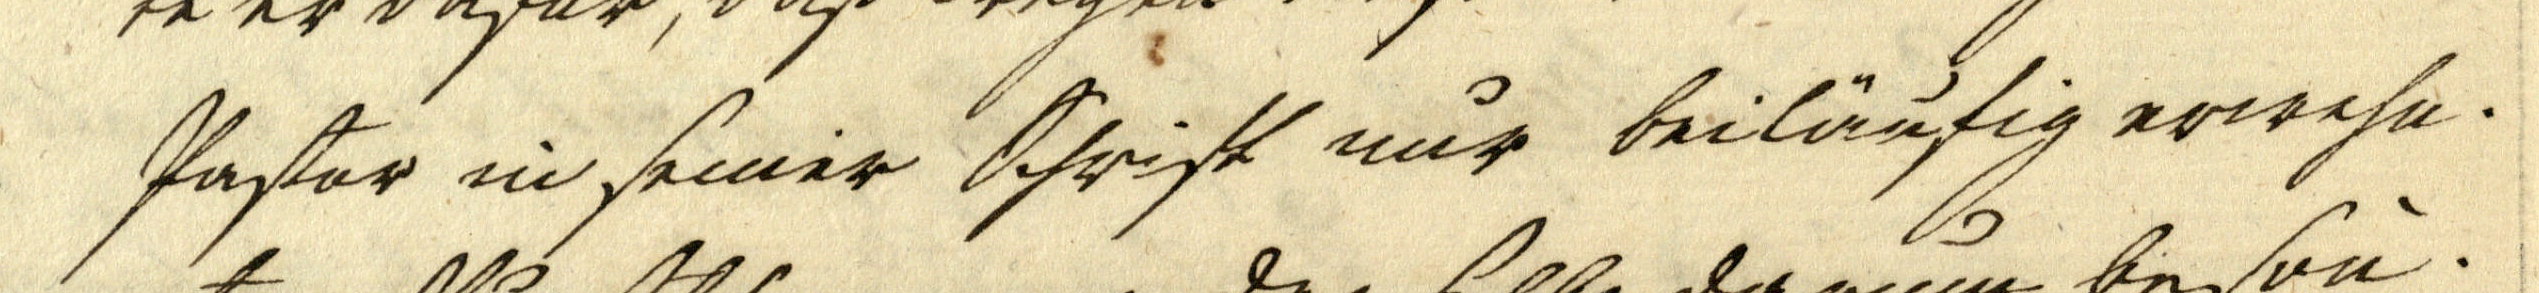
Pastor in seiner Schrift nur beiläufig erwehn-
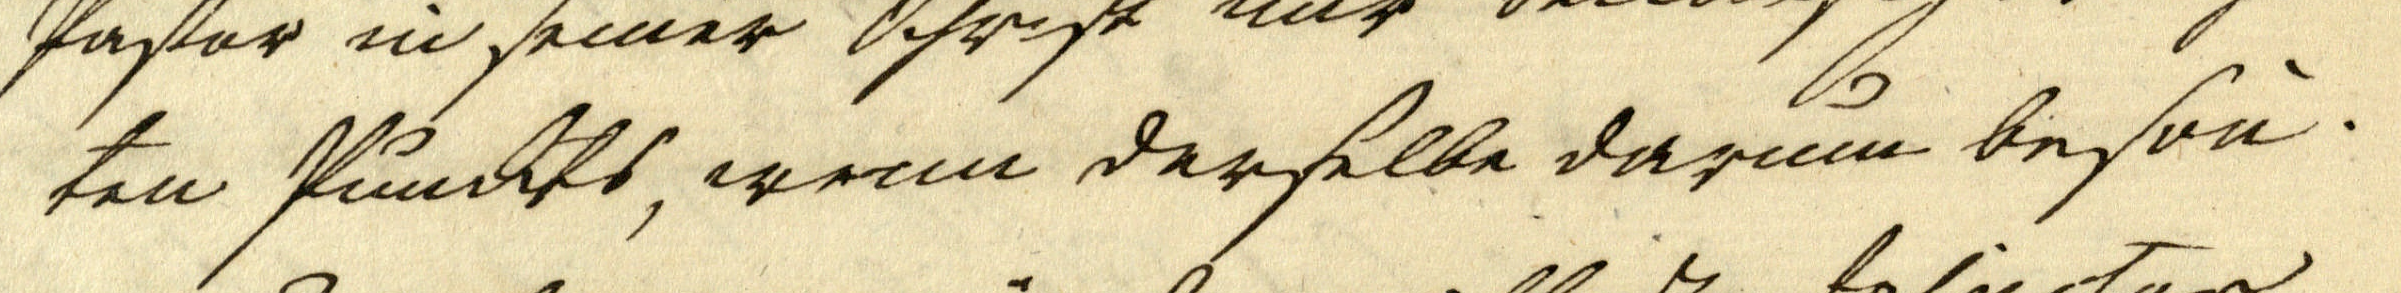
ten Punckts, wenn derselbe darum beson-
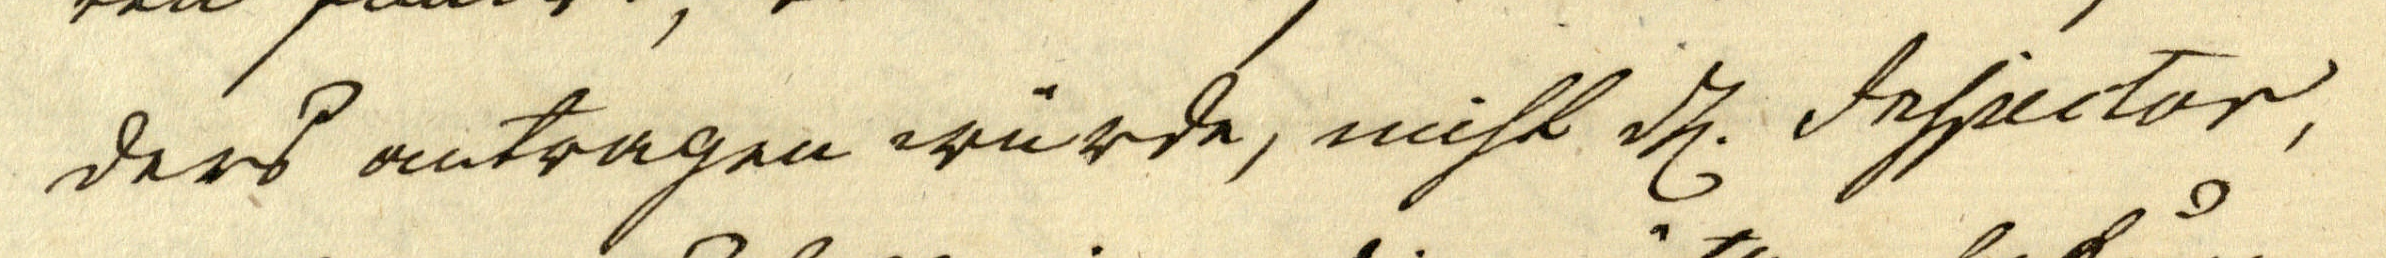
ders antragen würde, nicht dh. Inspector,
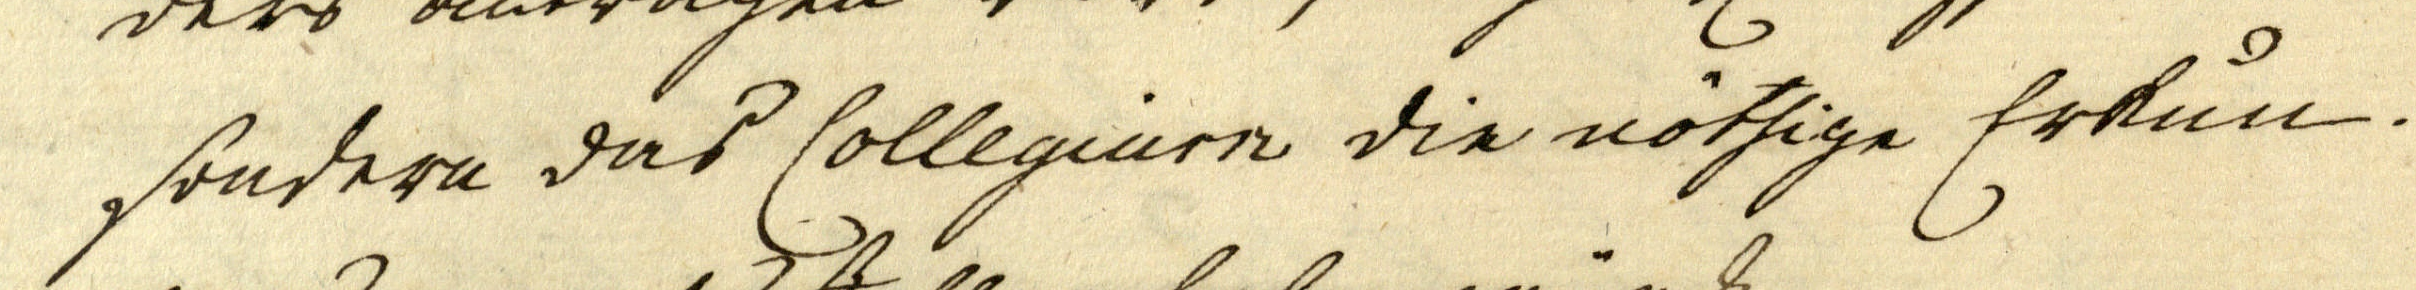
sondern das Collegium die nöthige Erkun-
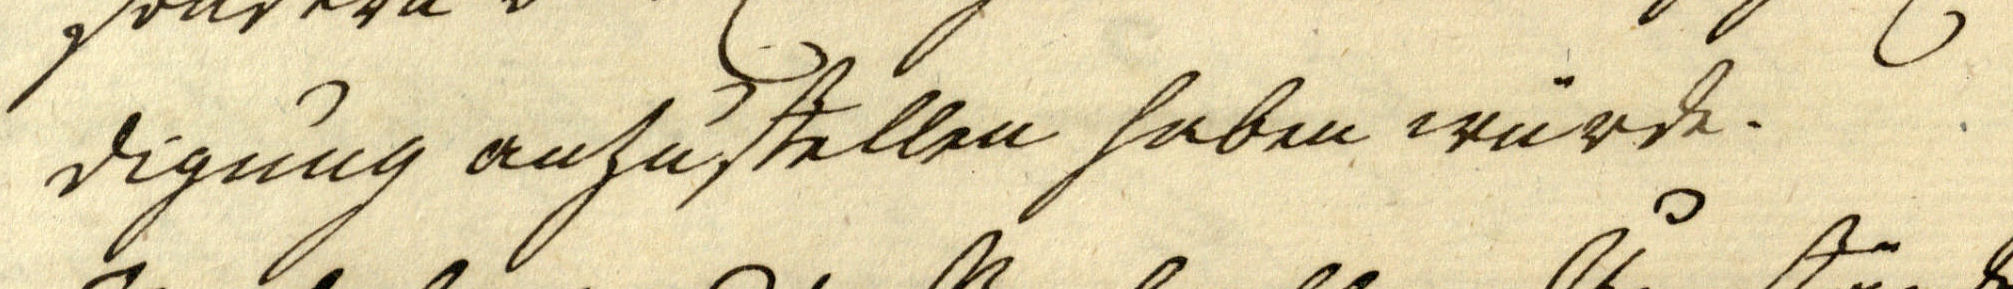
digung anzustellen haben würde.
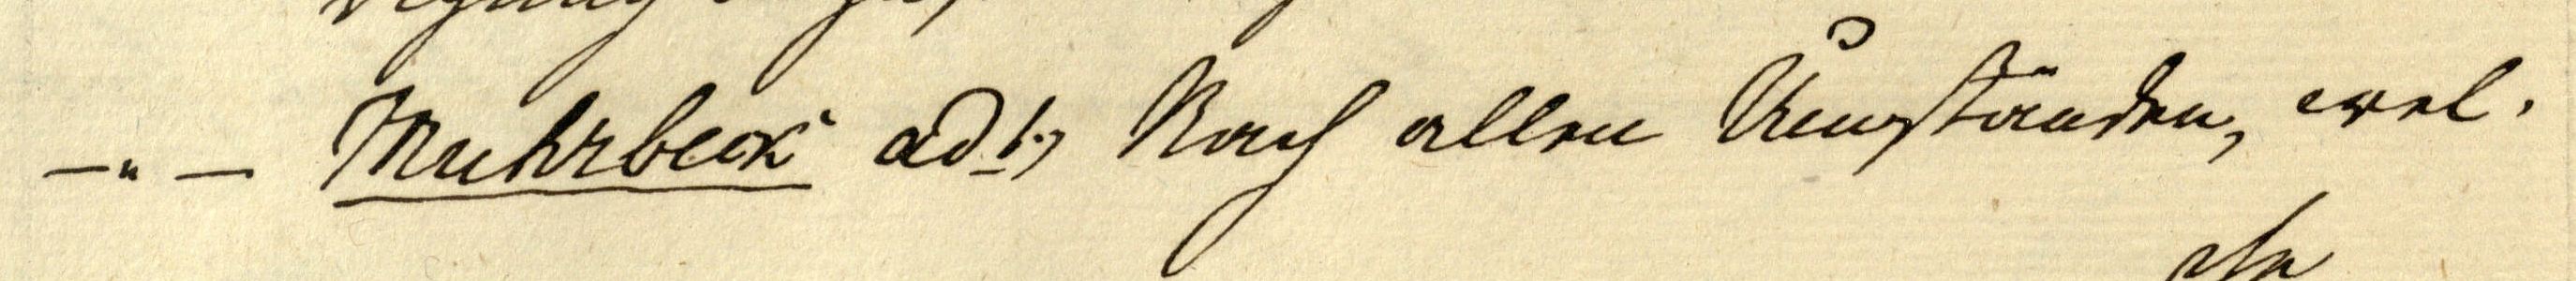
- " - Muhrbeck ad 1., Nach allen Umständen, wel-
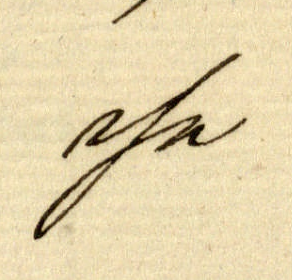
che
